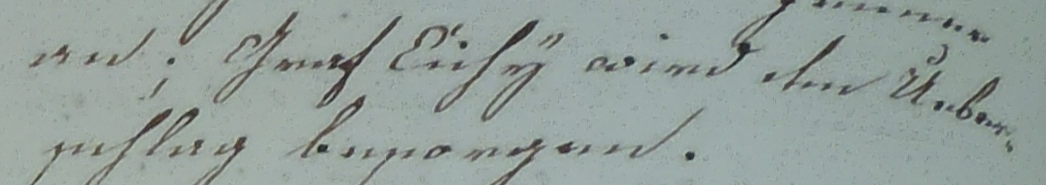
an; Graf Cichy wird den Ueber¬
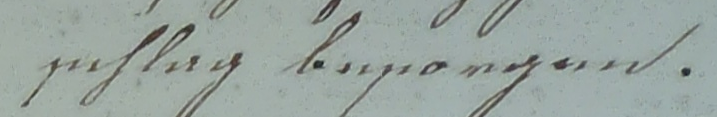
schlag besorgen.
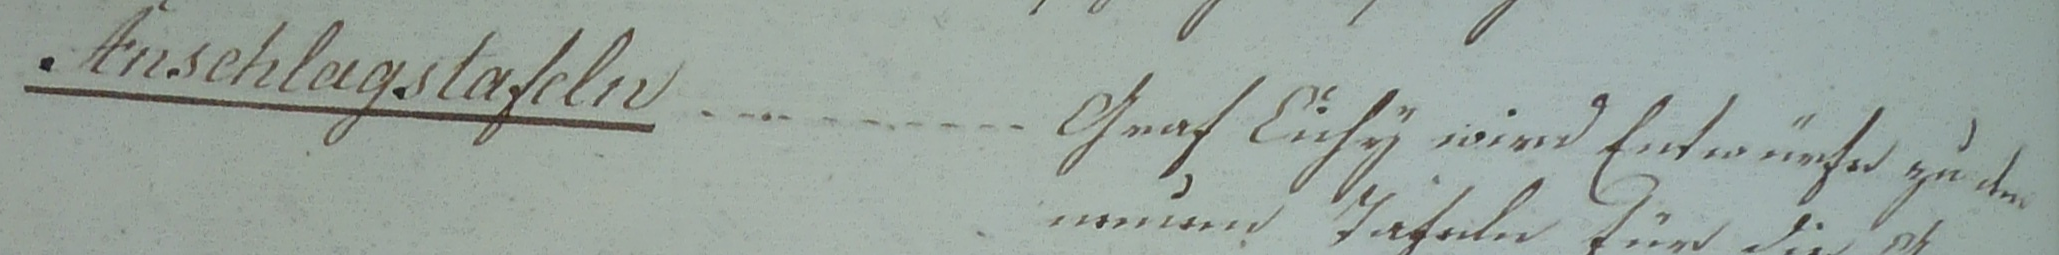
Anschlagstafeln ………. Graf Cichy wird Entwürfe zu den
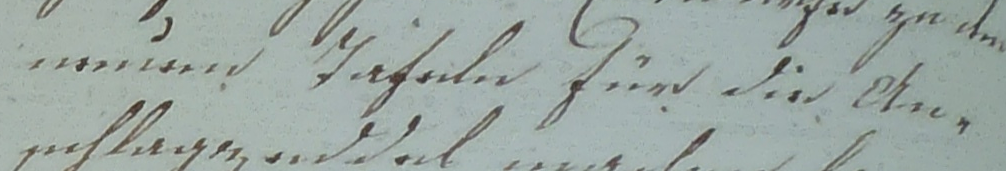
neuen Tafeln für die An¬
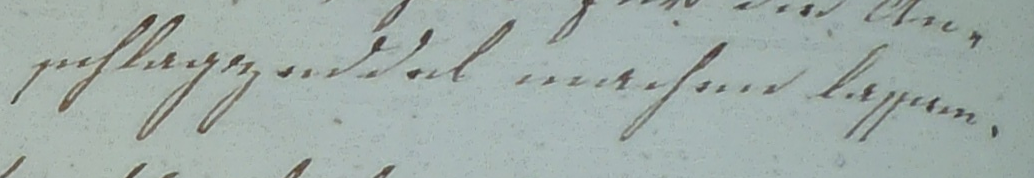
schlagzeddel machen lassen.
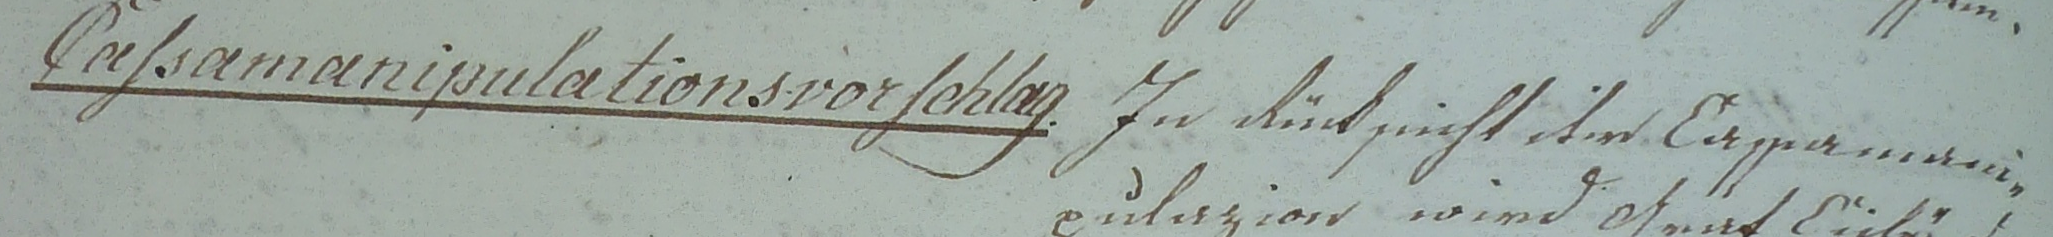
Cassamanipulationsvorschlag. In Rücksicht der Cassamani¬
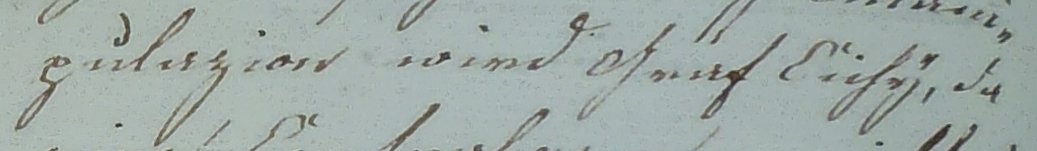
pulazion wird Graf Cichy, da
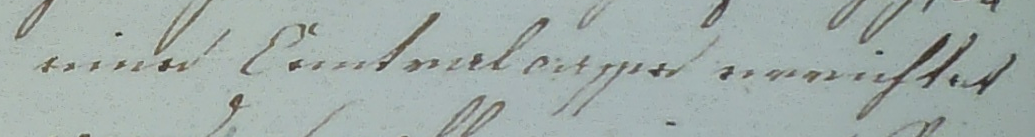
eine Centralcasse errichtet
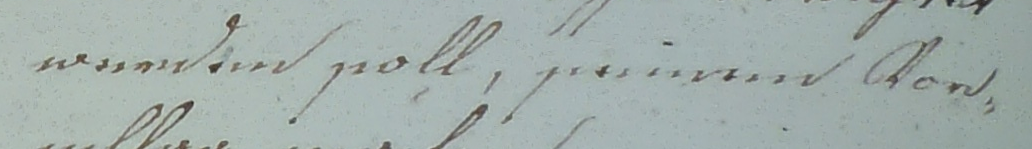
werden soll, seinen Vor¬
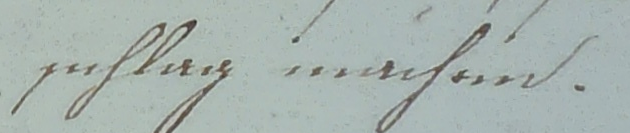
schlag machen.
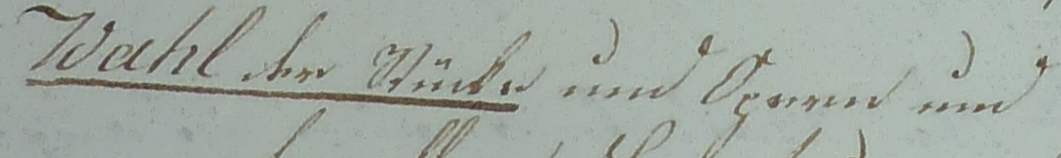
Wahl der Stücke und Opern und
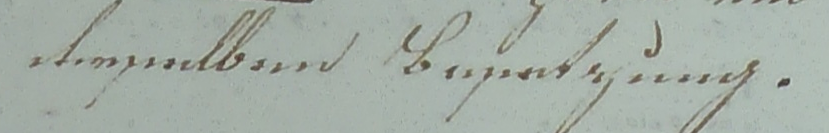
derselben Besetzung.
